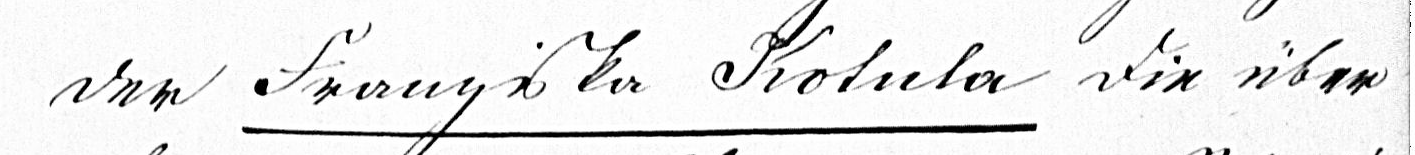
der Franziska Kotula die über
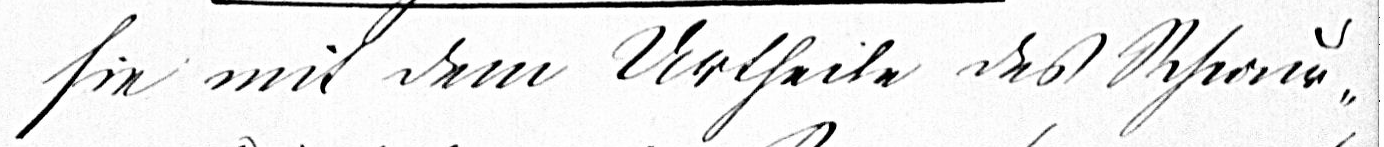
sie mit dem Urtheile des Schwur¬
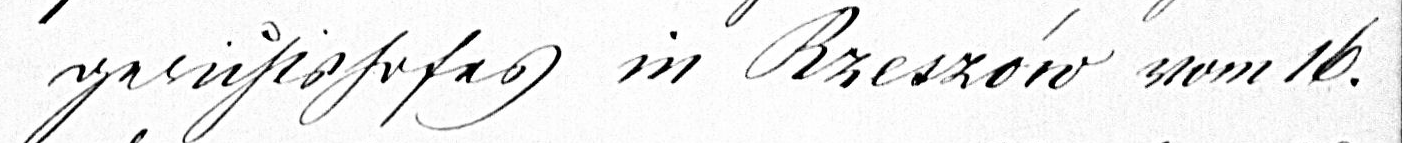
gerichtshofes in Rzeszów vom 16.
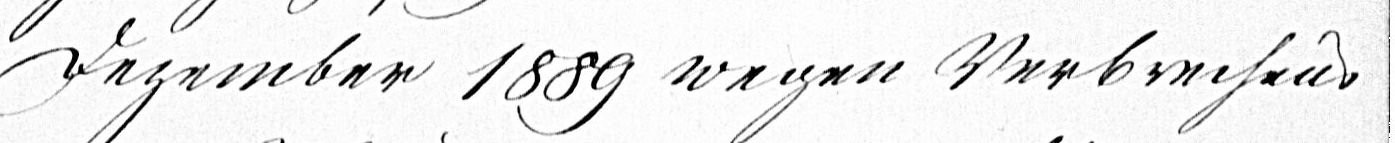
Dezember 1889 wegen Verbrechens
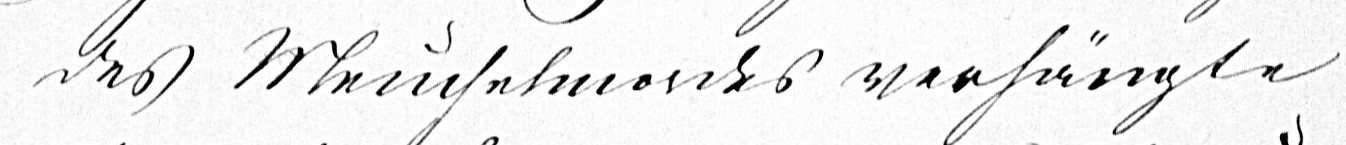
des Meuchelmordes verhängte
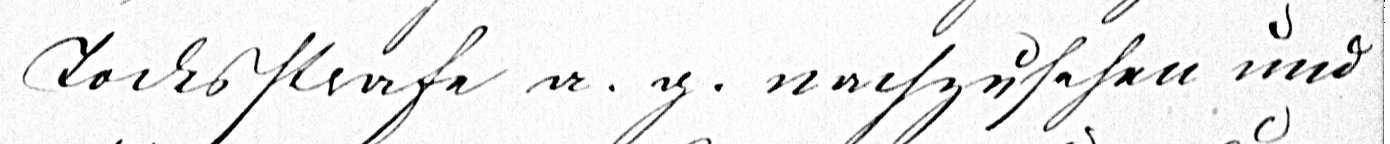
Todesstrafe a. g. nachzusehen und
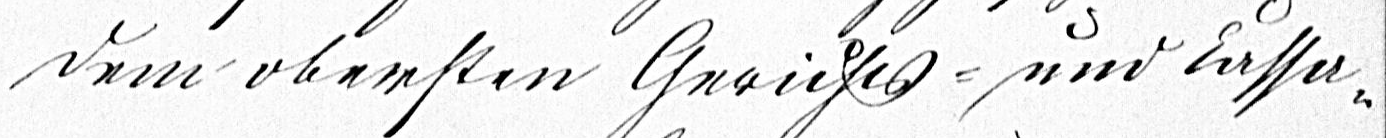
dem obersten Gerichts- und Cassa¬
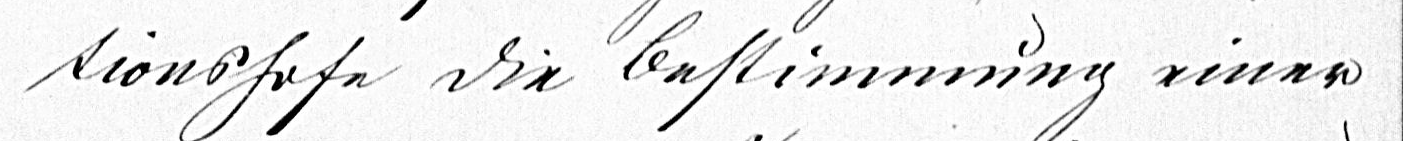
tionshofe die Bestimmung einer
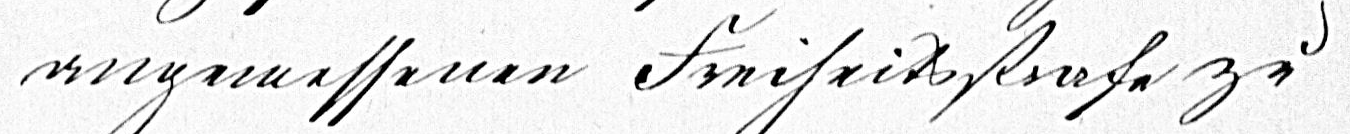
angemessenen Freiheitsstrafe zu
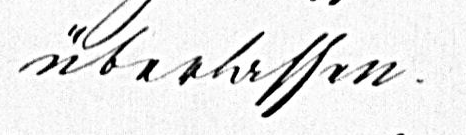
überlassen.
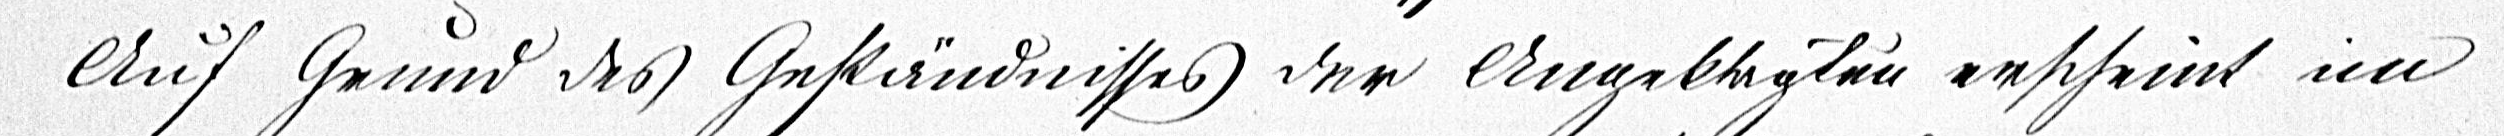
Auf Grund des Geständnisses der Angeklagten erscheint im
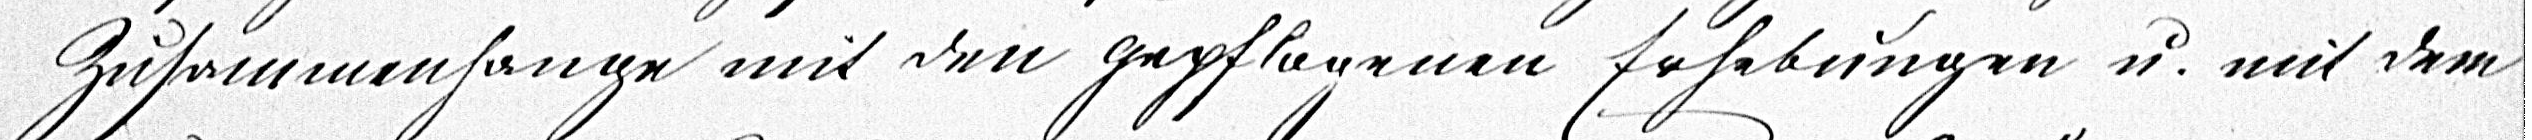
Zusammenhange mit den gepflogenen Erhebungen u. mit dem
